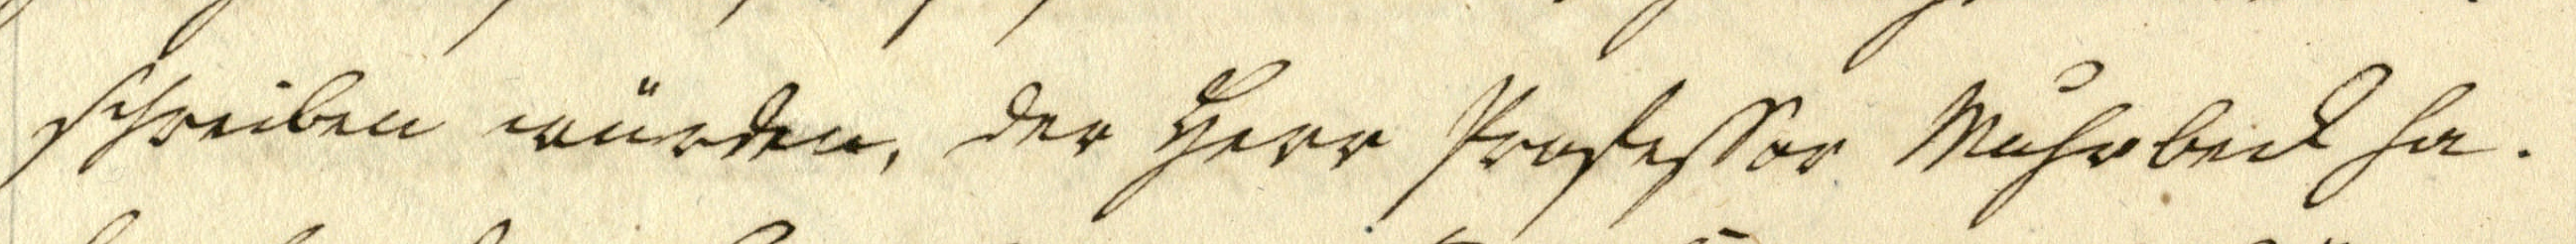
schreiben würden, der Herr Professor Muhrbeck ha¬
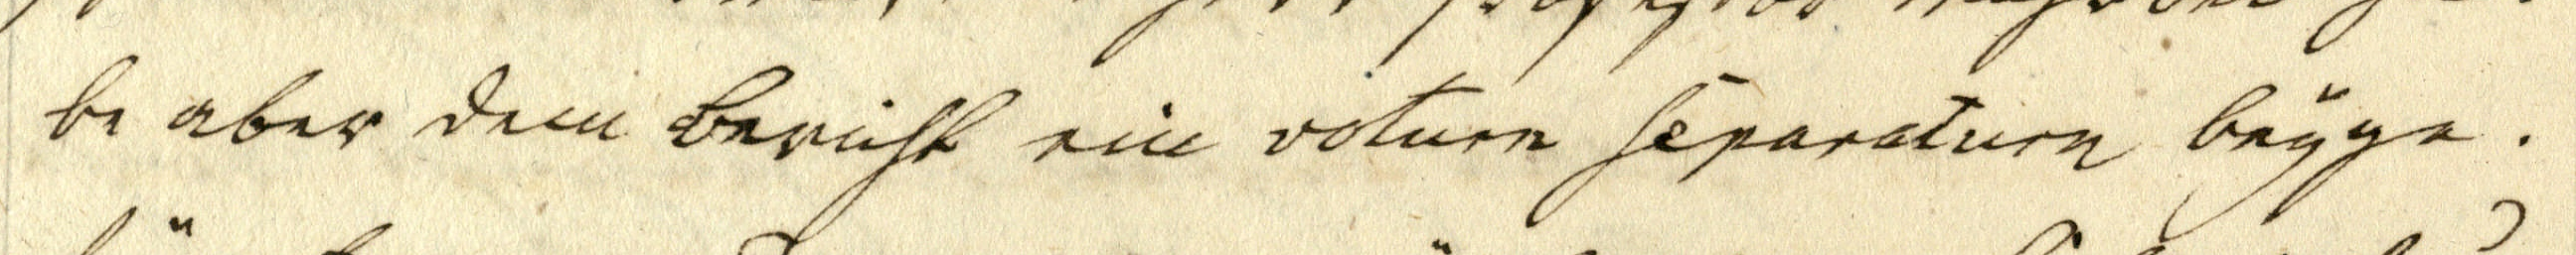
be aber dem Bericht ein votum separatum beÿge¬
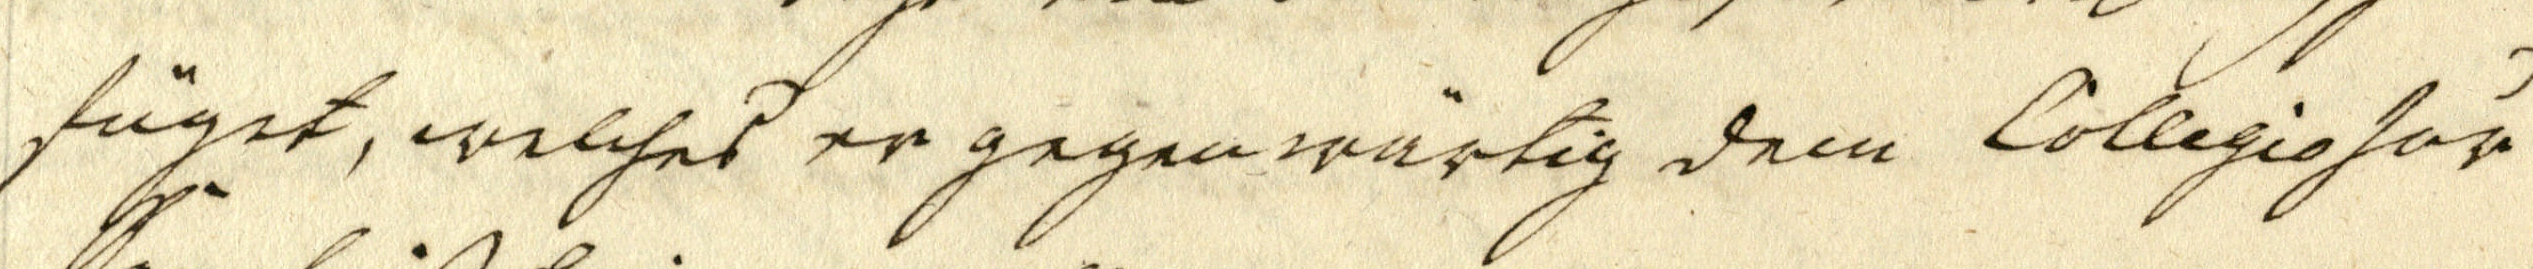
füget, welches er gegenwärtig dem Collegio zur
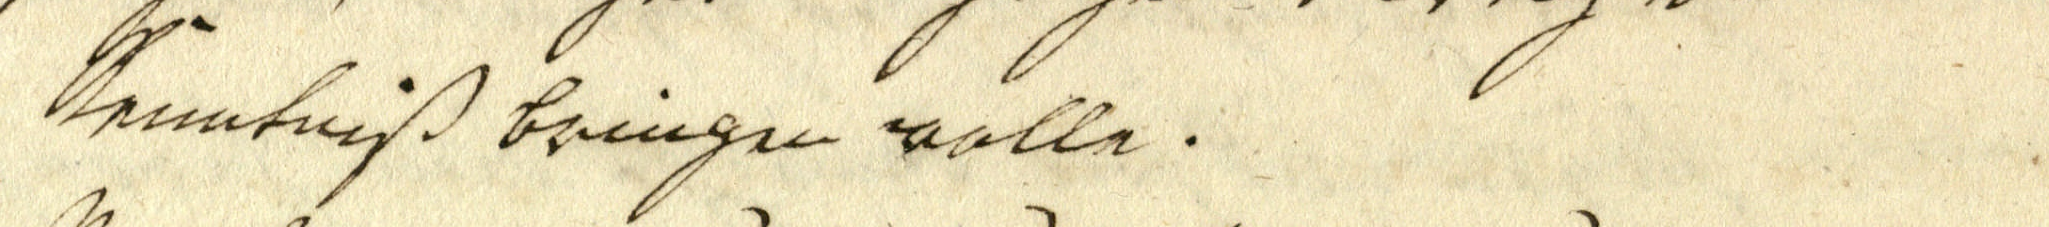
Kenntniß bringen wolle.
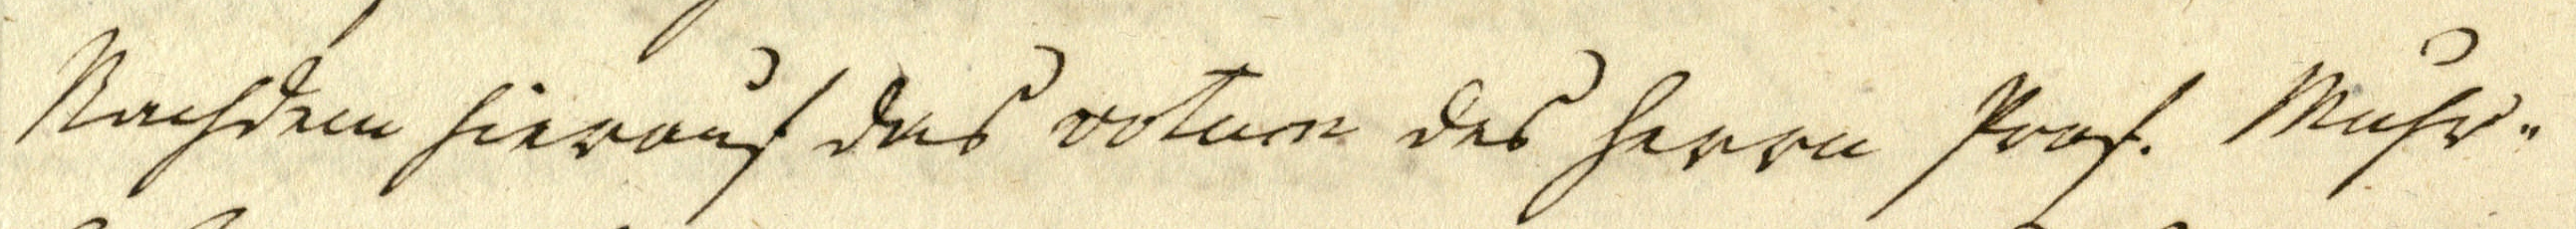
Nachdem hierauf das votum des herrn Prof. Muhr¬
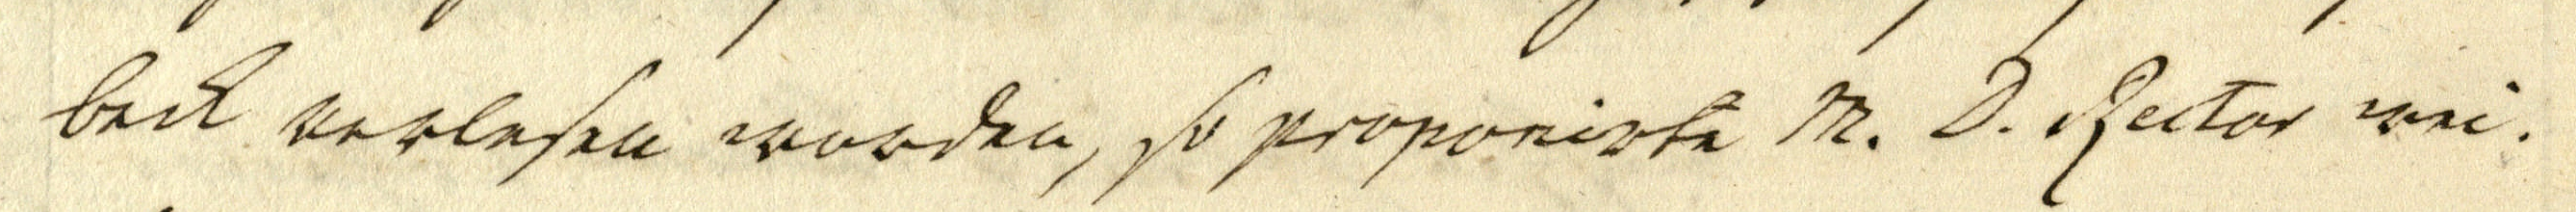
beck verlesen worden, so proponirte M. D. Rector wei¬
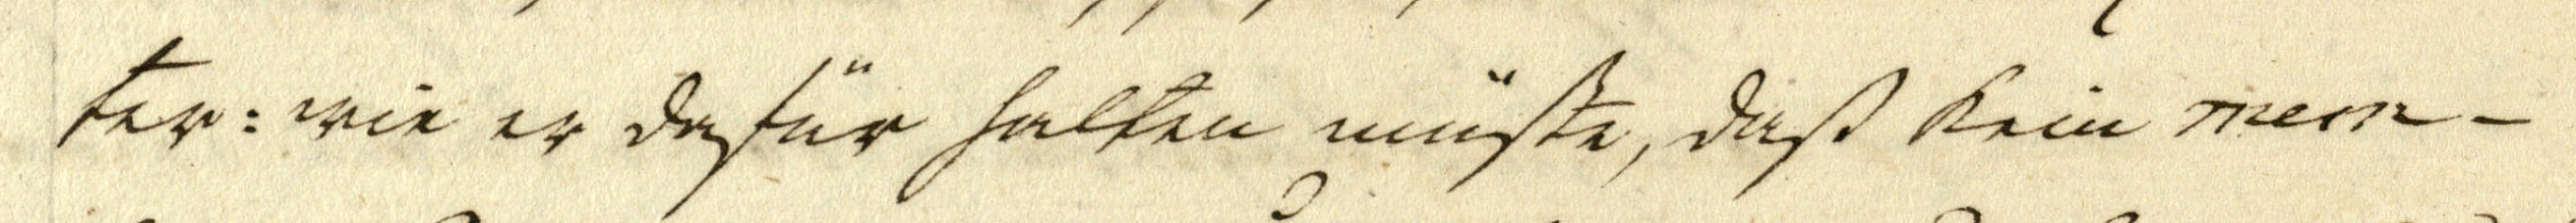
ter: wie er dafür halten müste, daß kein mem¬
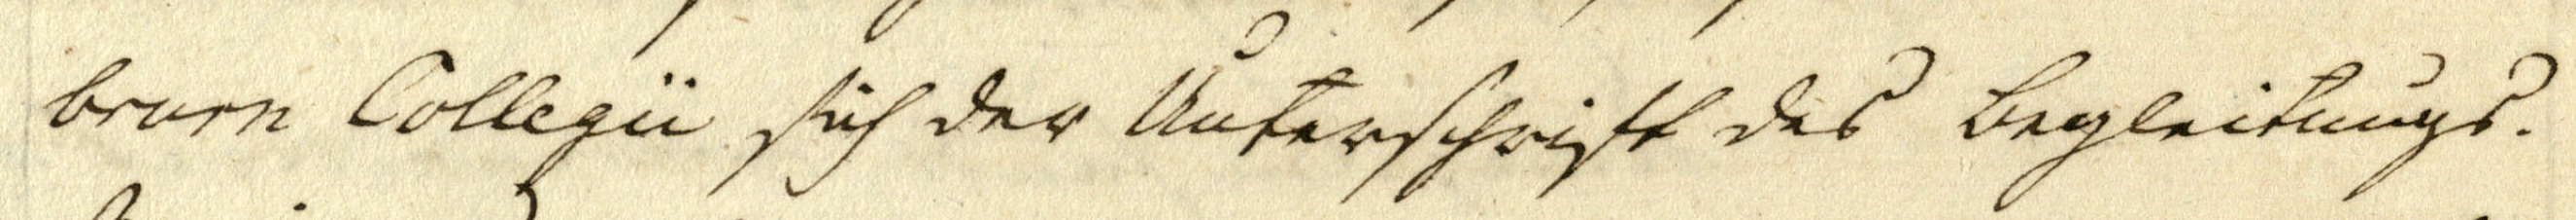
brum Collegii sich der Unterschrift des Begleitungs¬
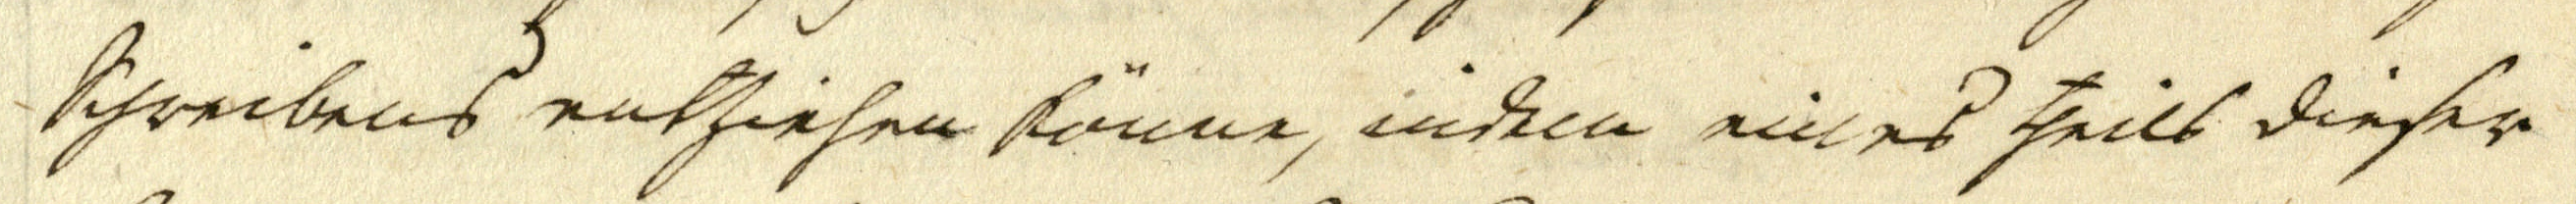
Schreibens entziehen könne, indem eines theils dieser
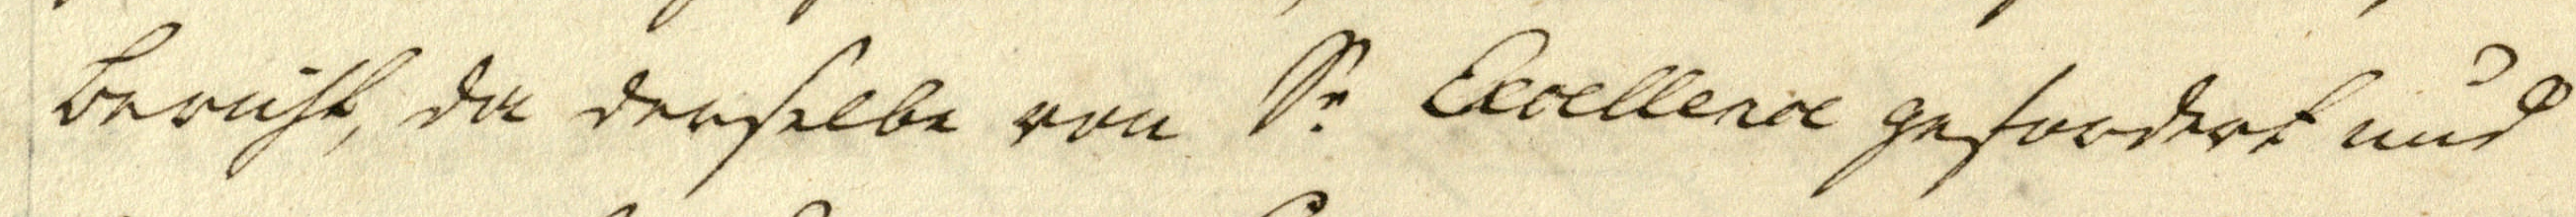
Bericht, da derselbe von Sr. Excellence gefordert und
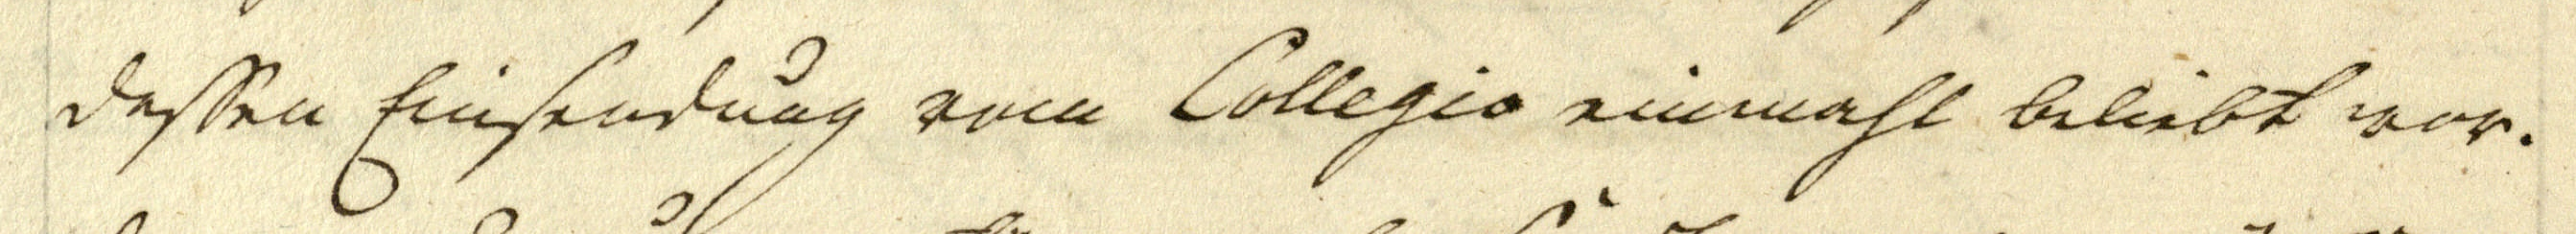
dessen Einsendung vom Collegio einmahl beliebt wor¬
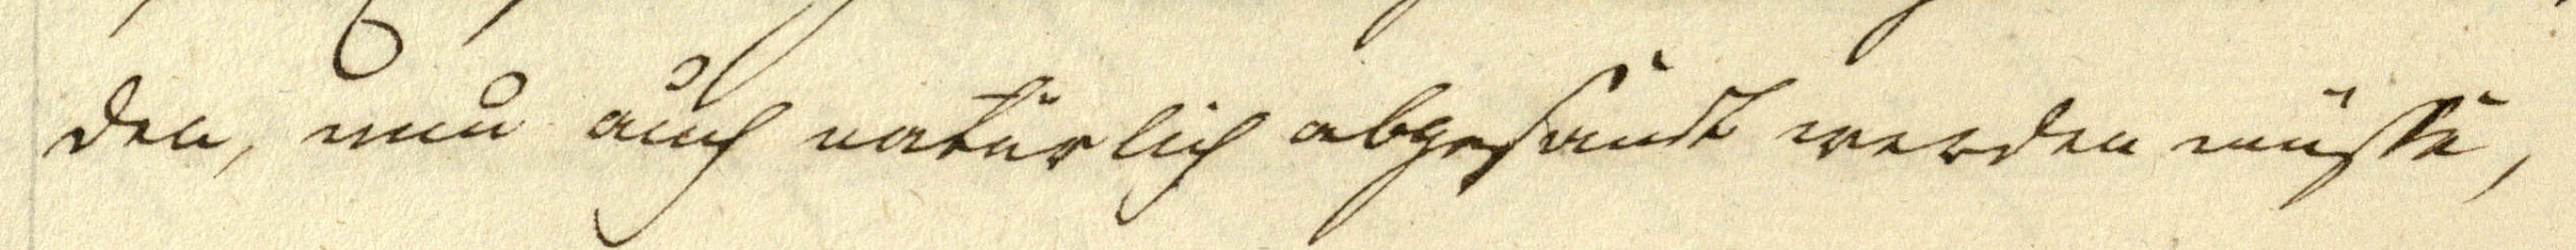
den nun auch natürlich abgesandt werden müsse,
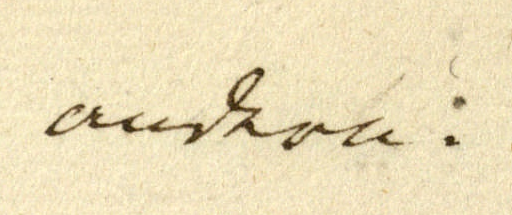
andern
